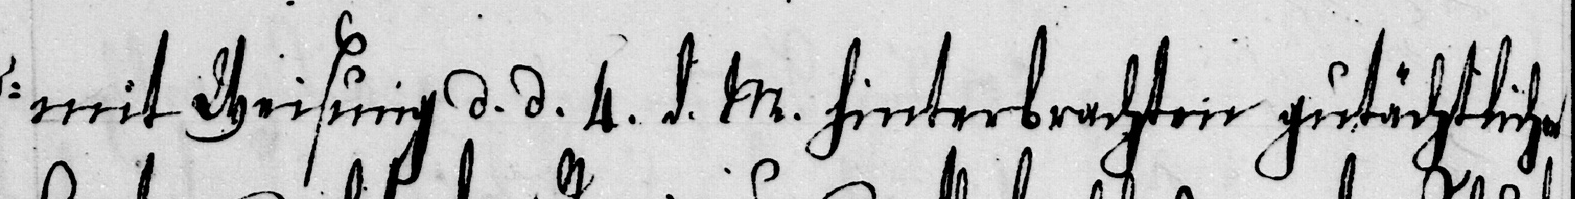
mit Weisung d. d. 4. d. M. hinterbrachten gutächtlich¬
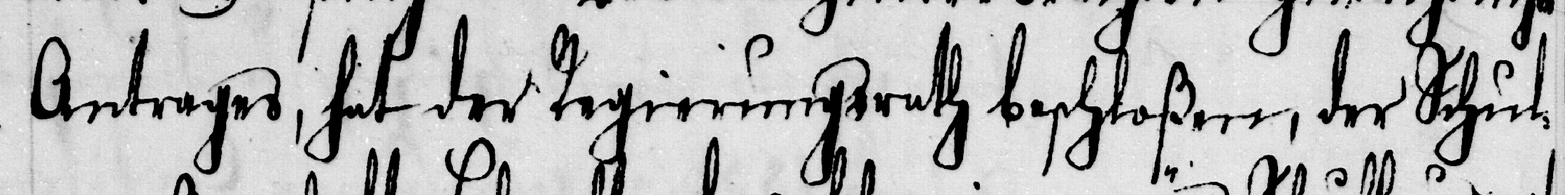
Antrages, hat der Regierungsrath beschloßen, der Schul¬
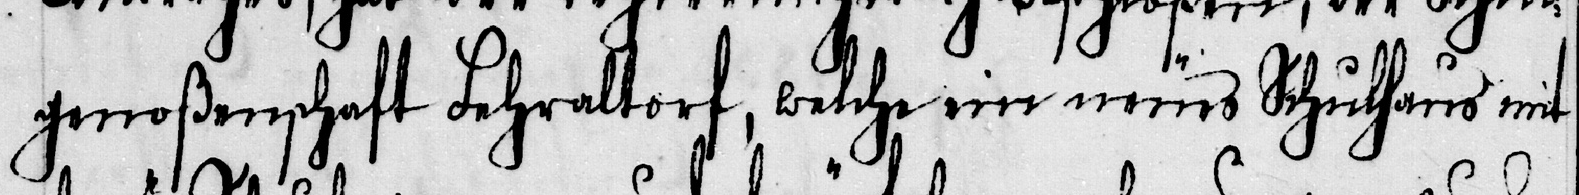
genoßenschaft Fehraltorf, welche ein neues Schulhaus mit
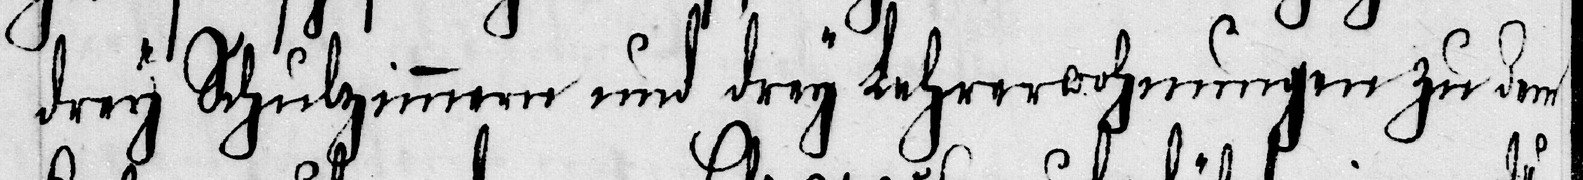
drey Schulzimmern und drey Lehrerwohnungen zu dem
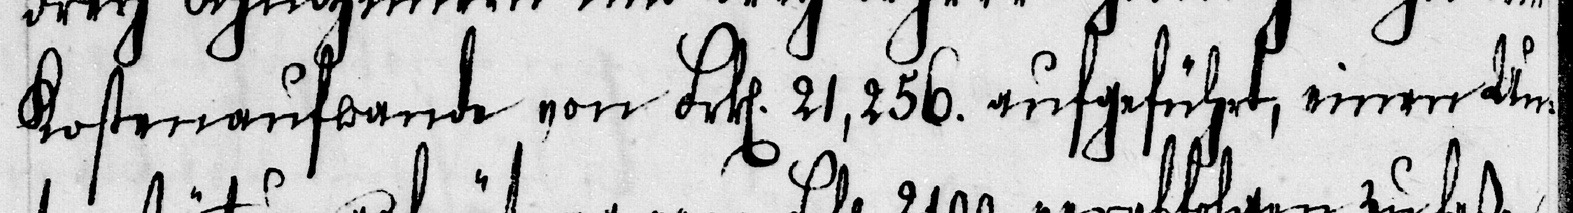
Kostenaufwande von Frk[en]. 21,256. aufgeführt, einen Un¬
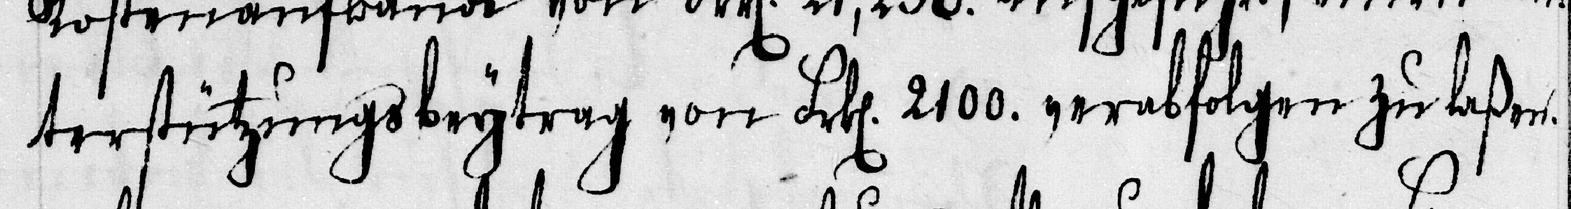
terstützungsbeytrag von Frk[en]. 2100. verabfolgen zu laßen.
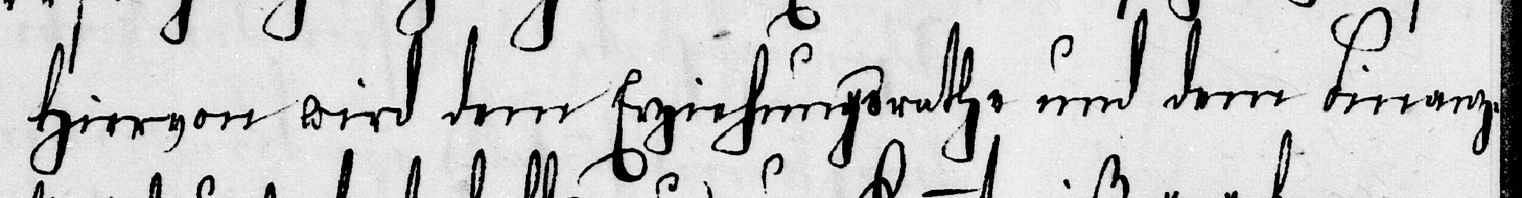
Hiervon wird dem Erziehungsrathe und dem Finanz¬
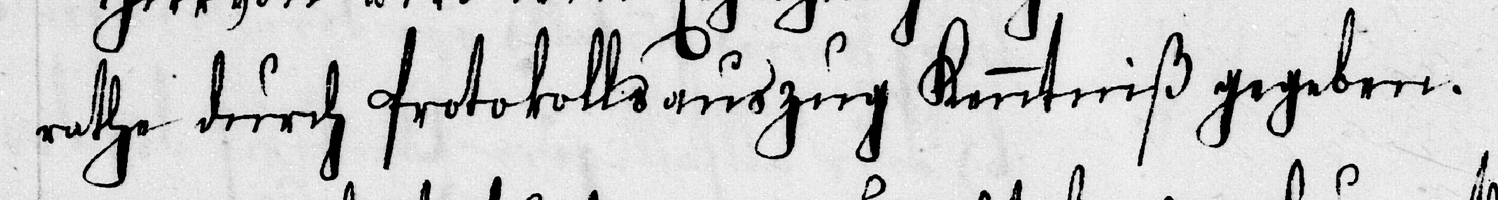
rathe durch Protokollsauszug Kenntniß gegeben.
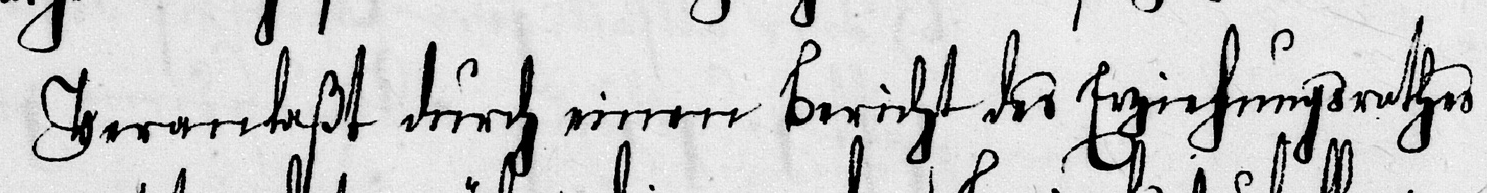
Veranlaßt durch einen Bericht des Erziehungsrathes
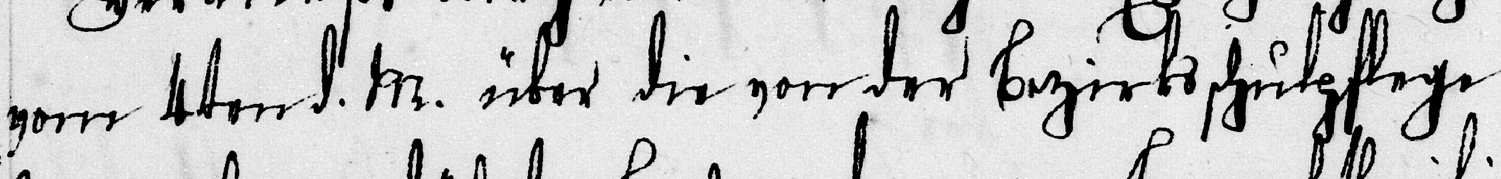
vom 4ten d. M. über die von der Bezirksschulpflege
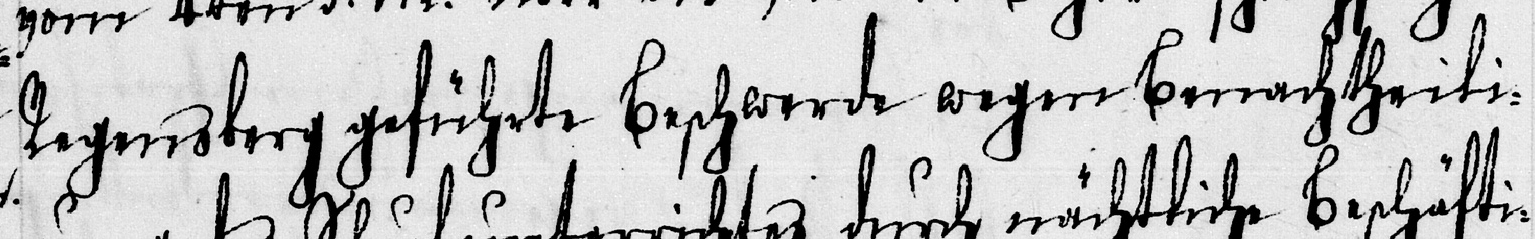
Regensberg geführte Beschwerde wegen Benachtheili¬
